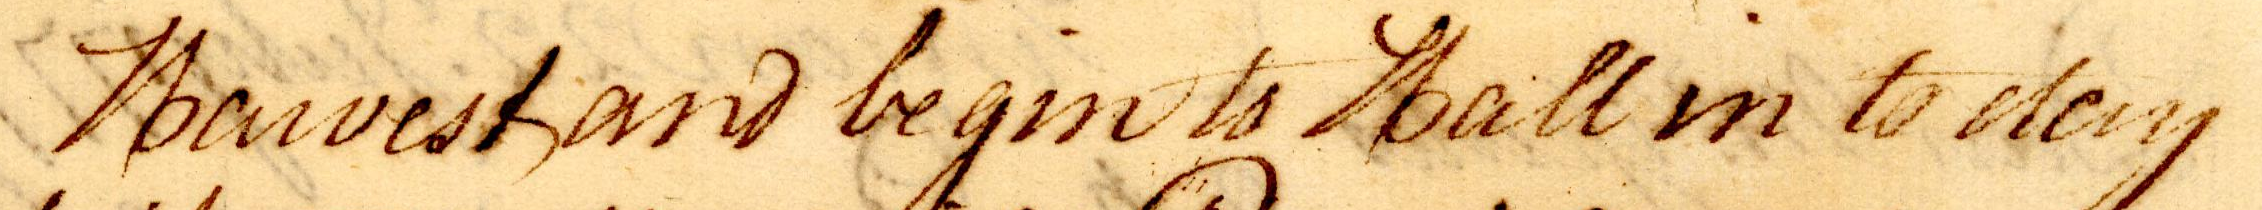Harvest and begin to Hall in to day
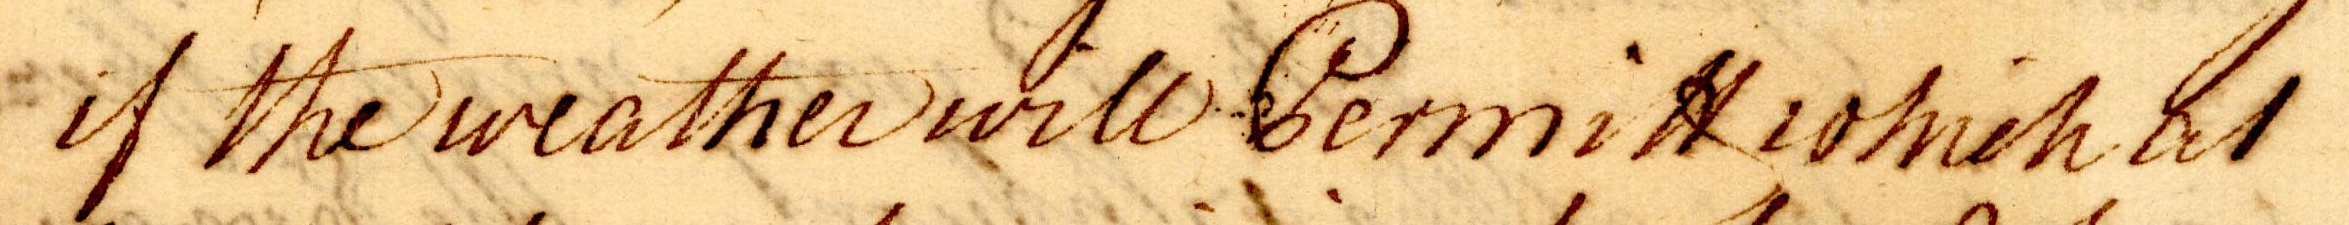if the weather will Permitt which at
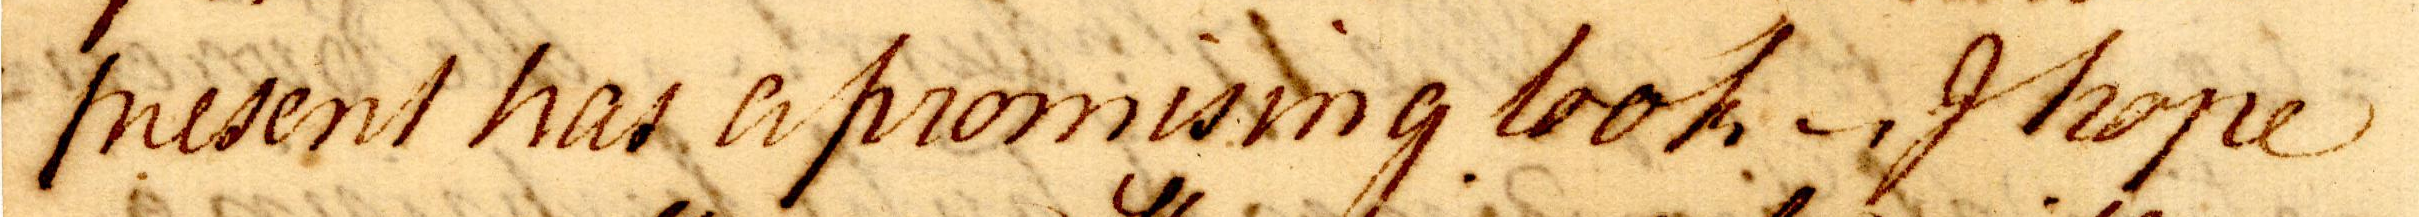present has a promising look. I hope
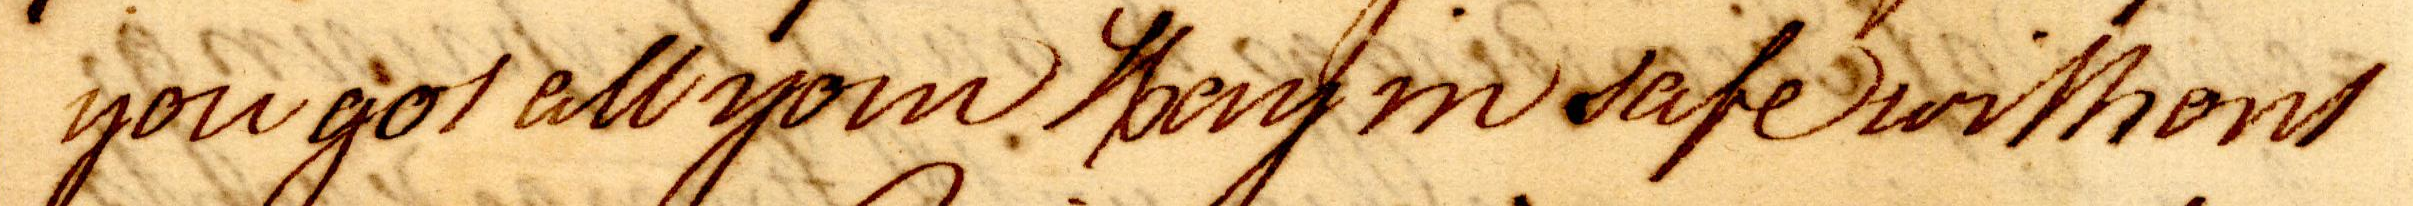you got all your Hay in safe without
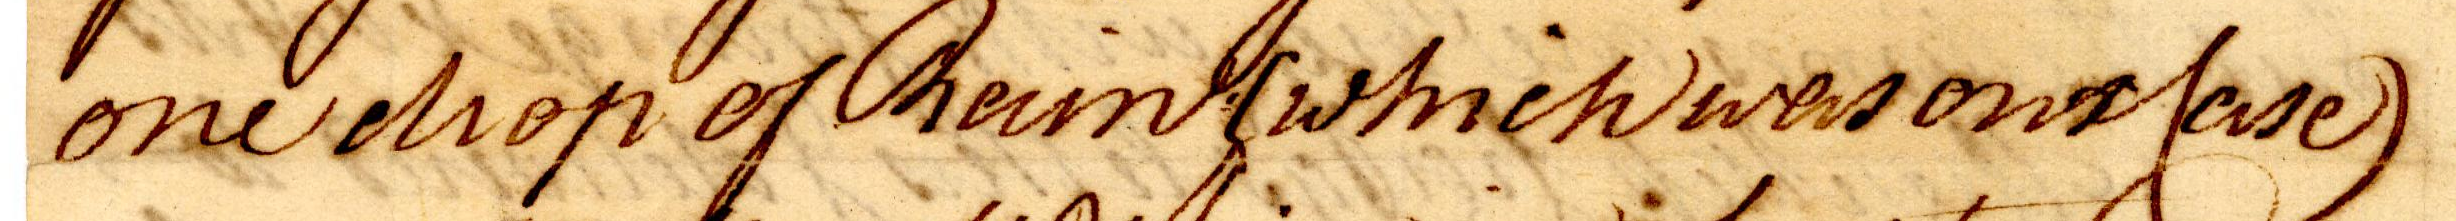one drop of Rain (which was our Case)
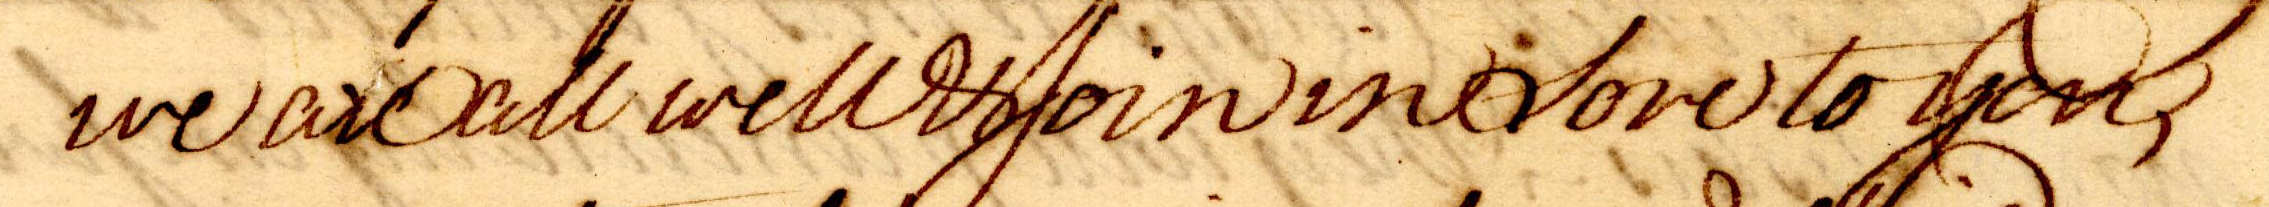we are all well & join in Love to you,
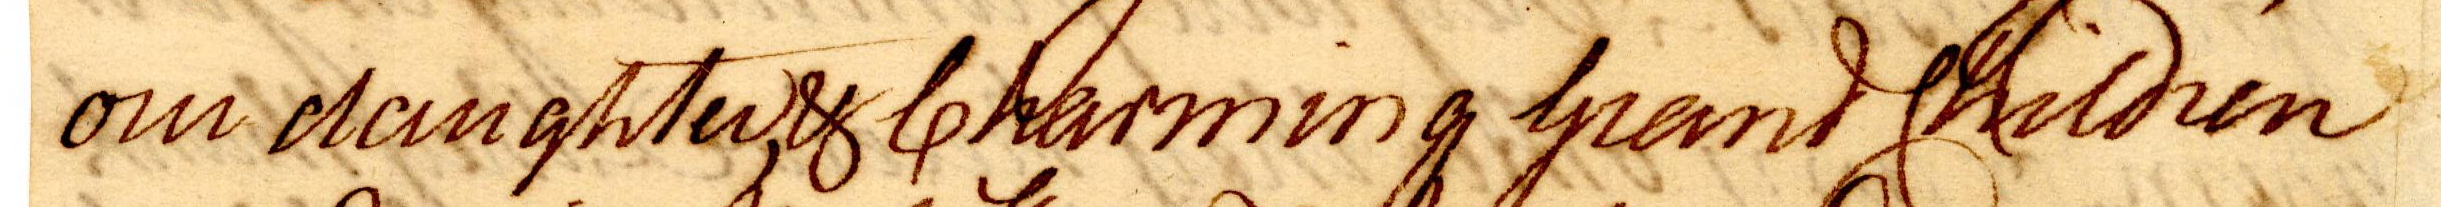our daughter, & Charming Grand Children
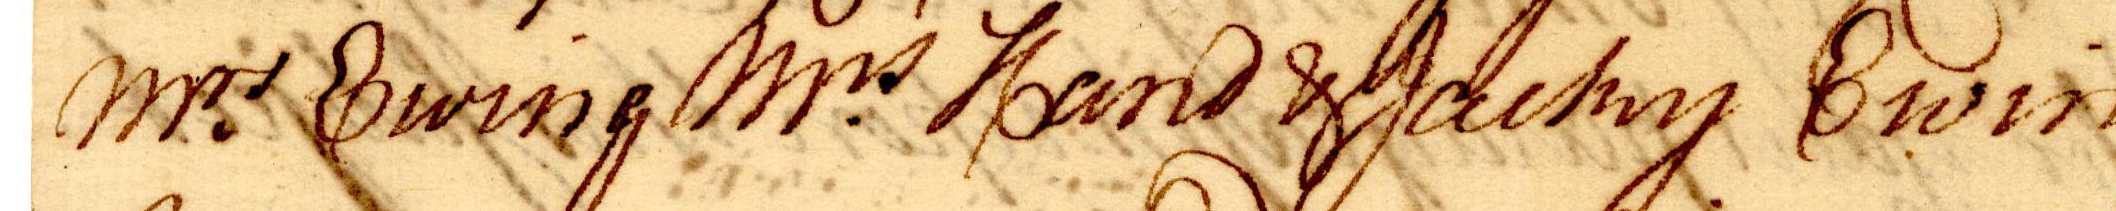M^rs. Ewing M^rs. Hand & Jacky Ewing &
